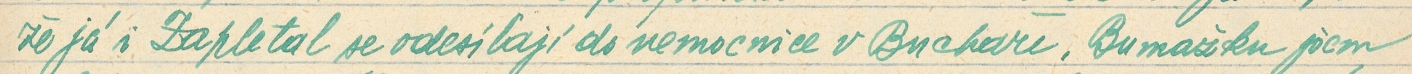že já i Zapletal se odesílají do nemocnice v Buchaře. Bumažku jsem
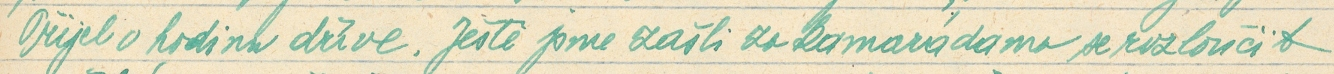Přijel o hodinu dříve. Ještě jsme zašli za kamarádama se rozloučit
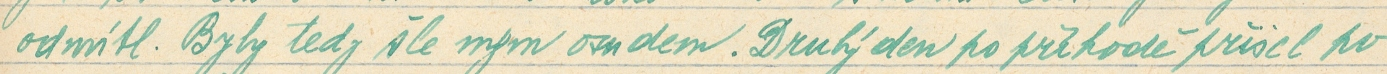odmítl. Byly tedy šle mým osudem. Druhý den po příhodě přišel po
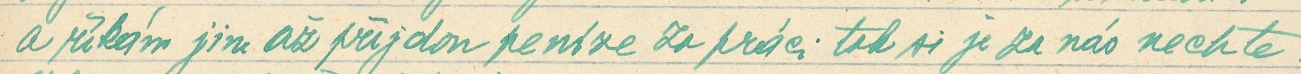a říkám jim až přijdou peníze za práci tak si je za nás nechte.
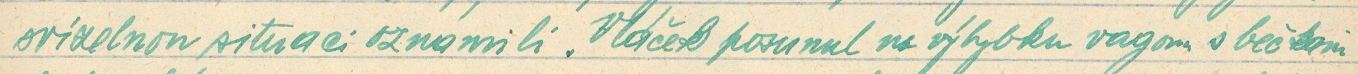svízelnou situaci oznámili. Vláček posunul na výhybku vagonu s bečkami
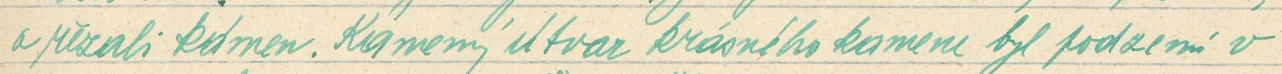a řezali kámen. Kamený útvar krásného kamene byl podzemí v
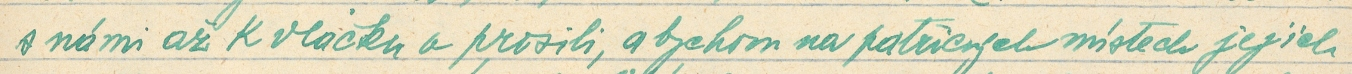s námi až k vlačku a prosili, abychom na patřicných místech jejich
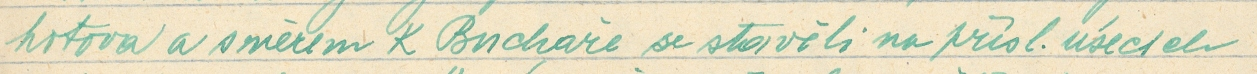hotova a směrem k Buchaře se stavěli na přísl. úsecích
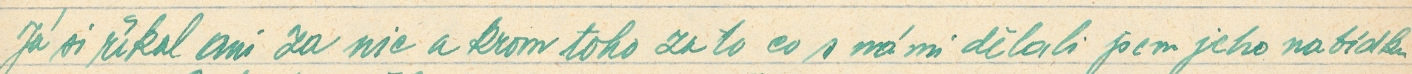Já si říkal ani za nic a krom toho za to co s námi dělali jsem jeho nabídku
